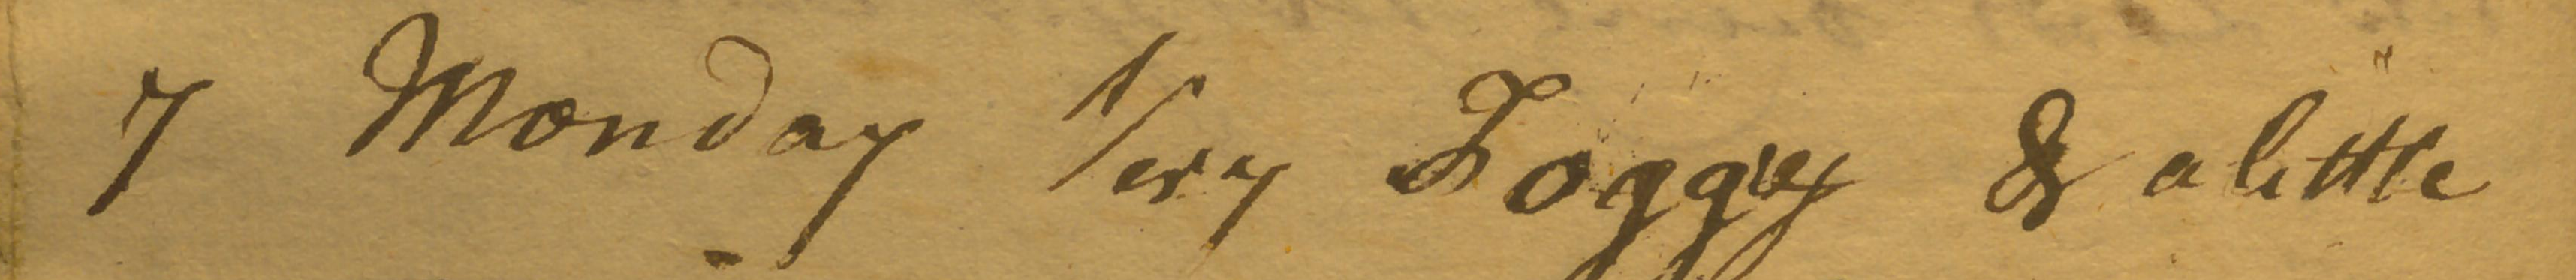7 Monday Very Foggey & a little
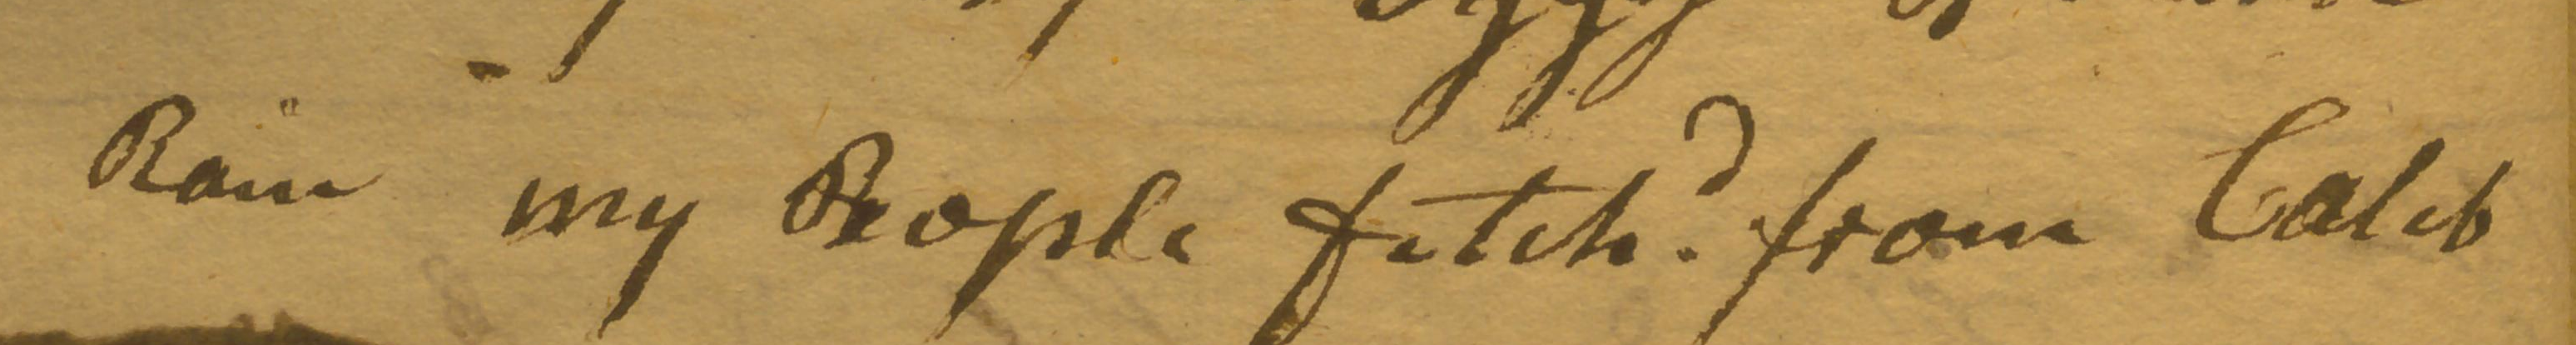Rain my People fetch^d. from Caleb
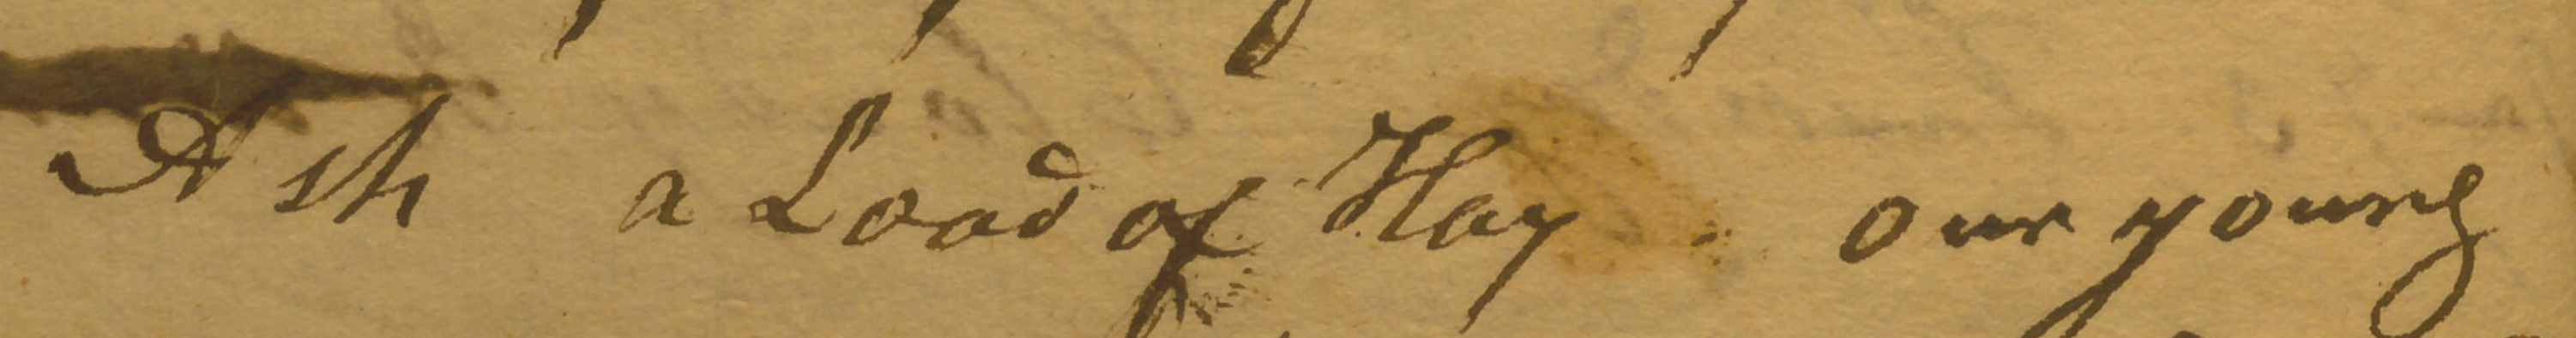Ash a Load of Hay our young
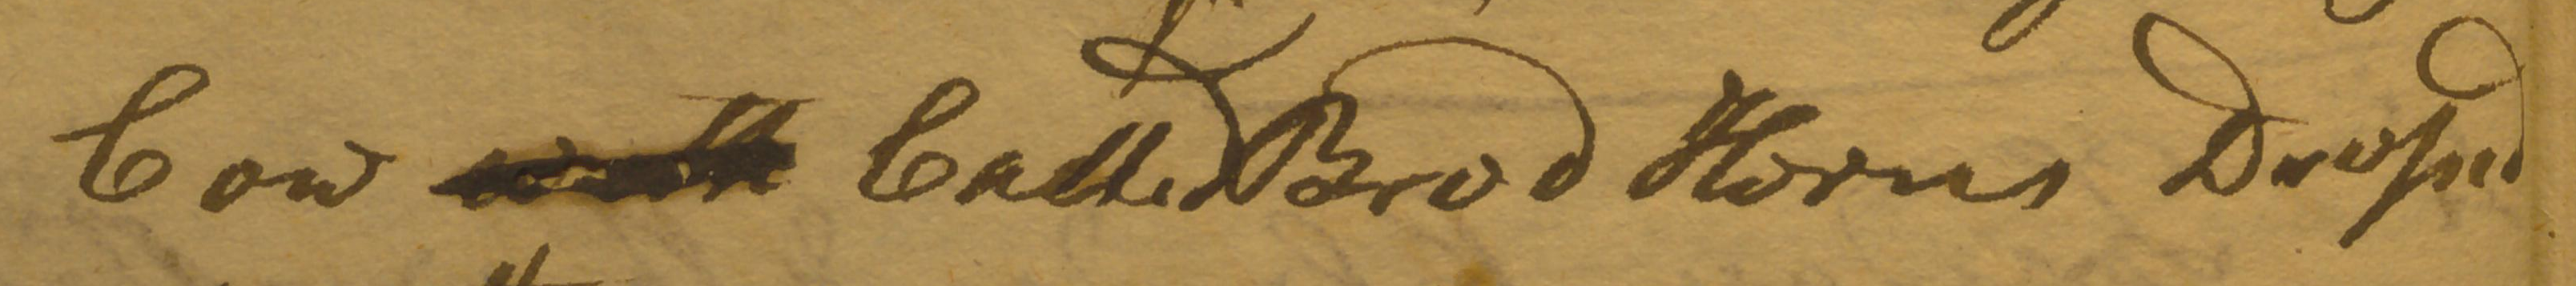Cow [with] Called Brod Horns Droped
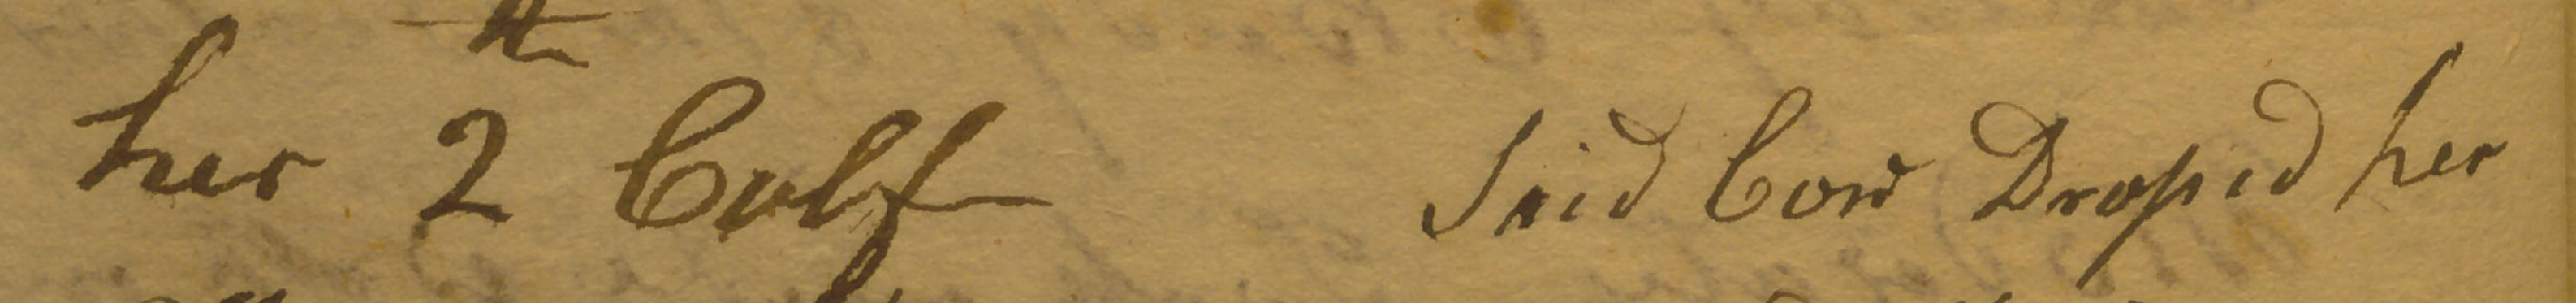her 2^th Calf said Cow Droped her
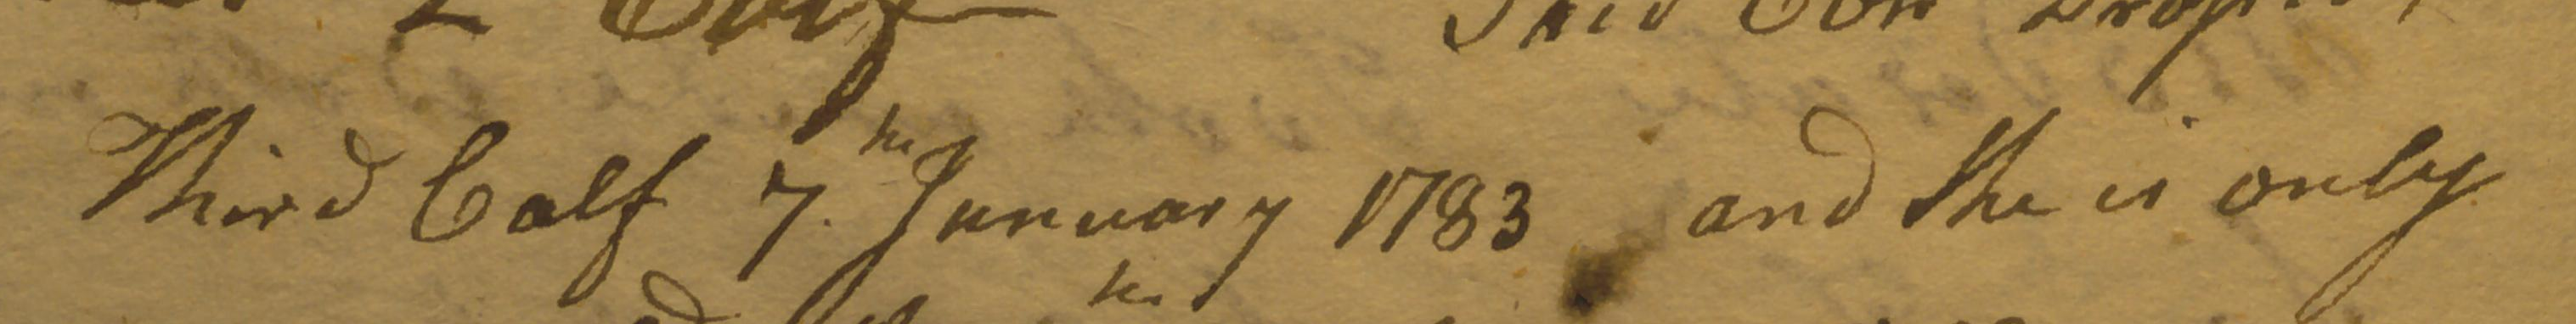Third Calf 7^th. January 1783 and she is only
